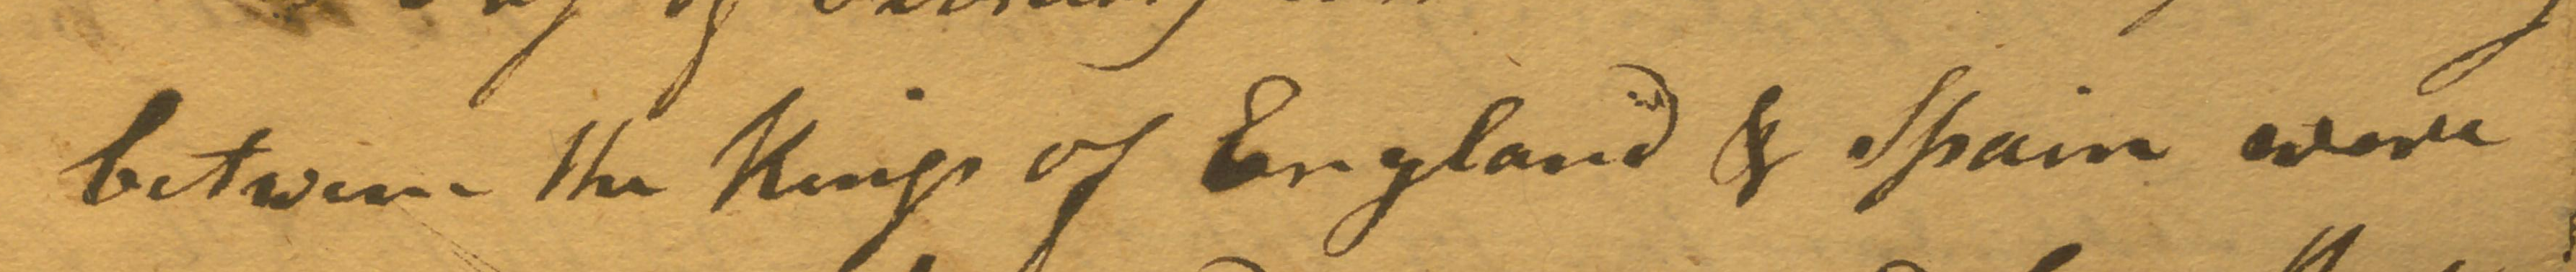between the Kings of England & spain were
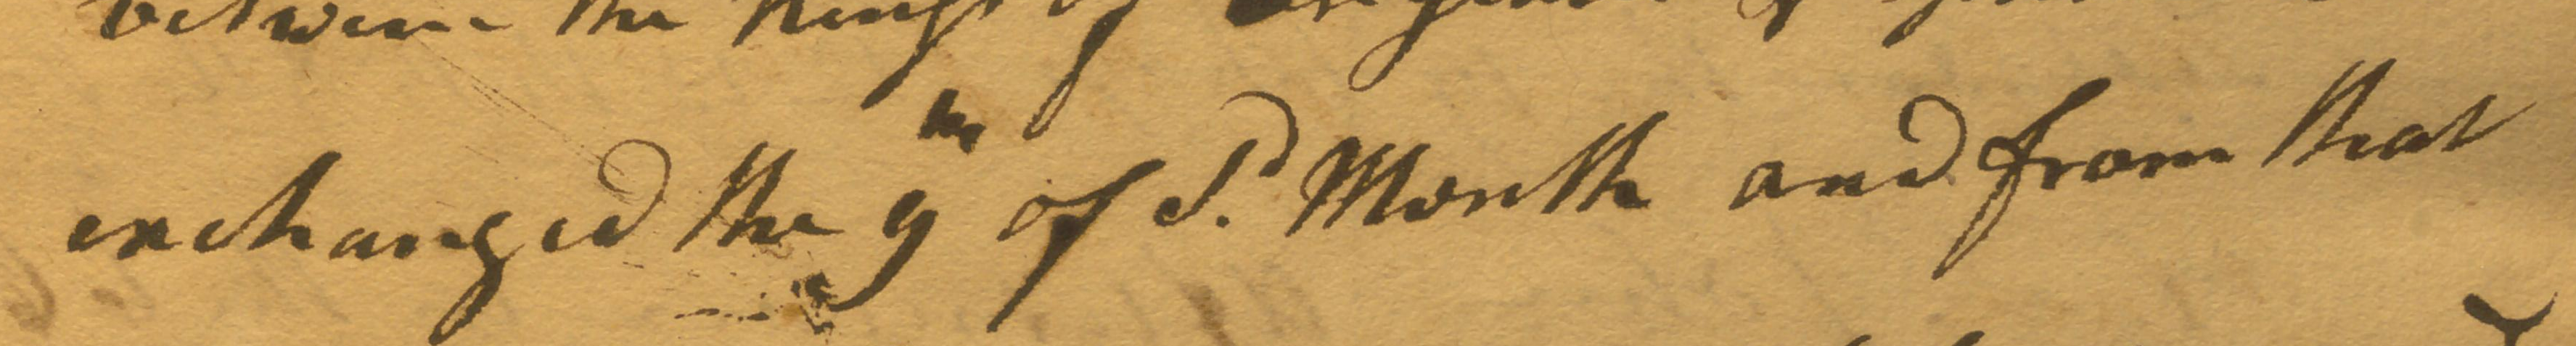exchanged the 9^th of S^d. Month and from that
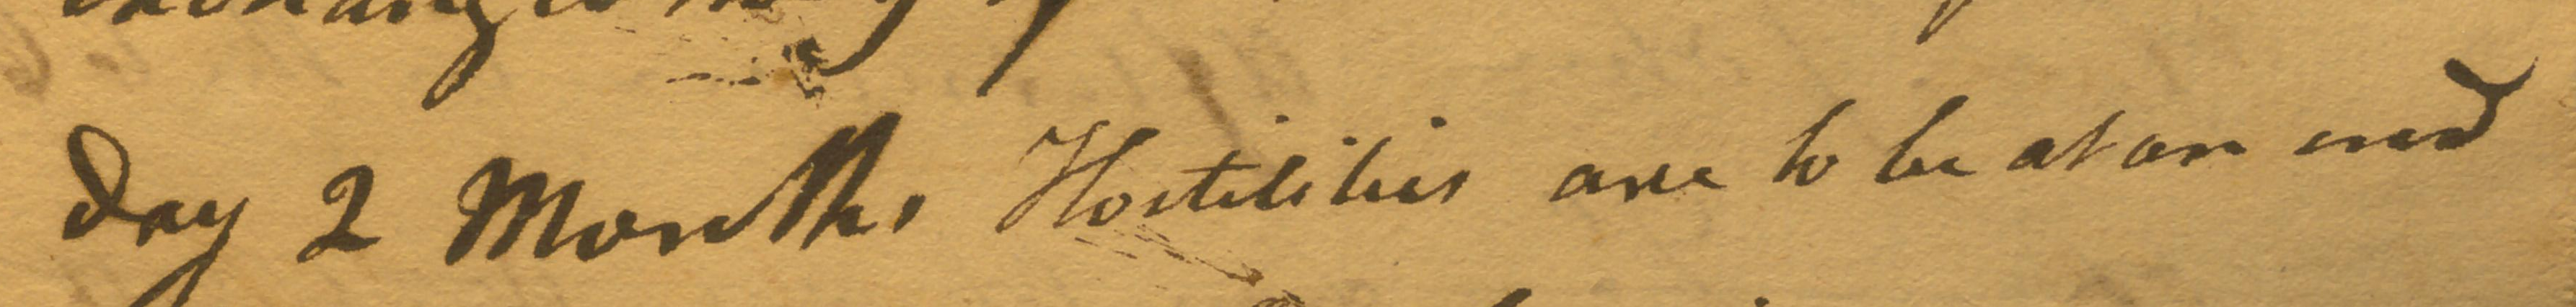day 2 Months Hostilities are to be at an and
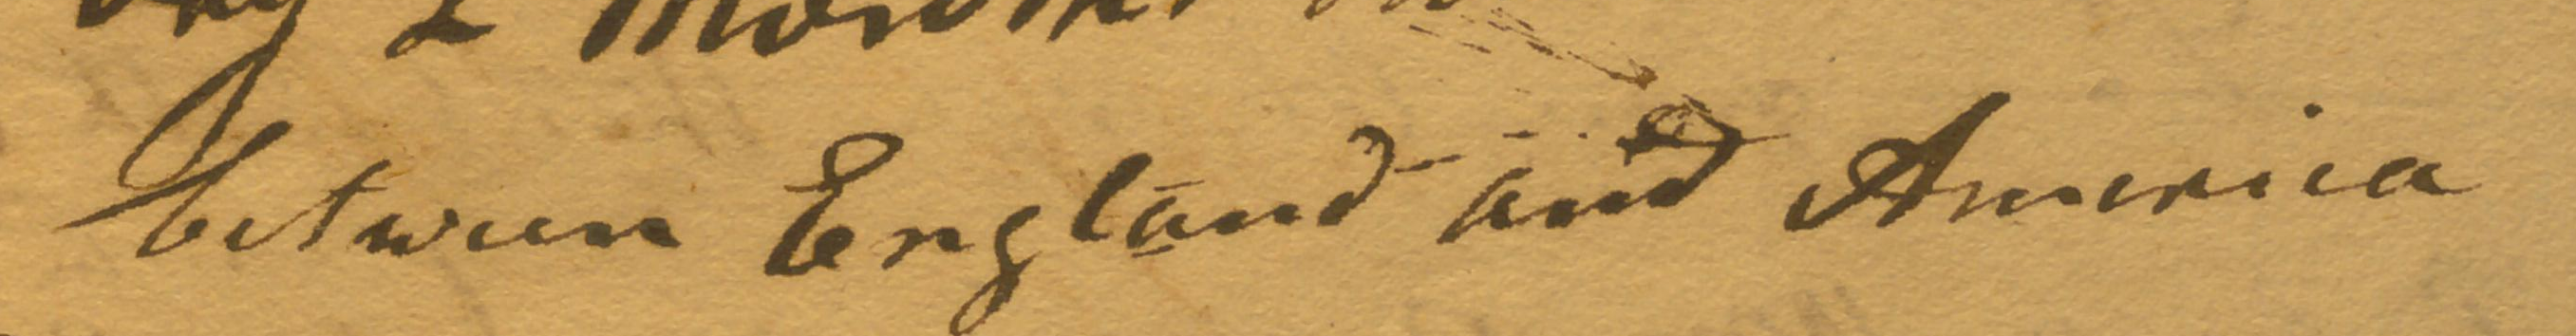between England and America
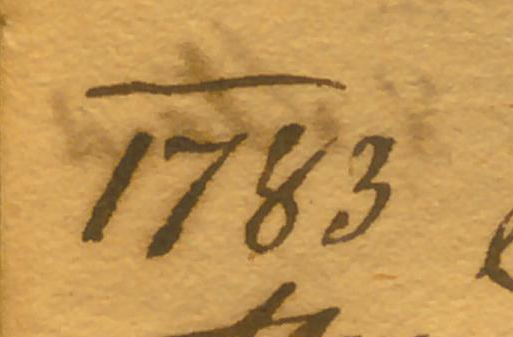1783
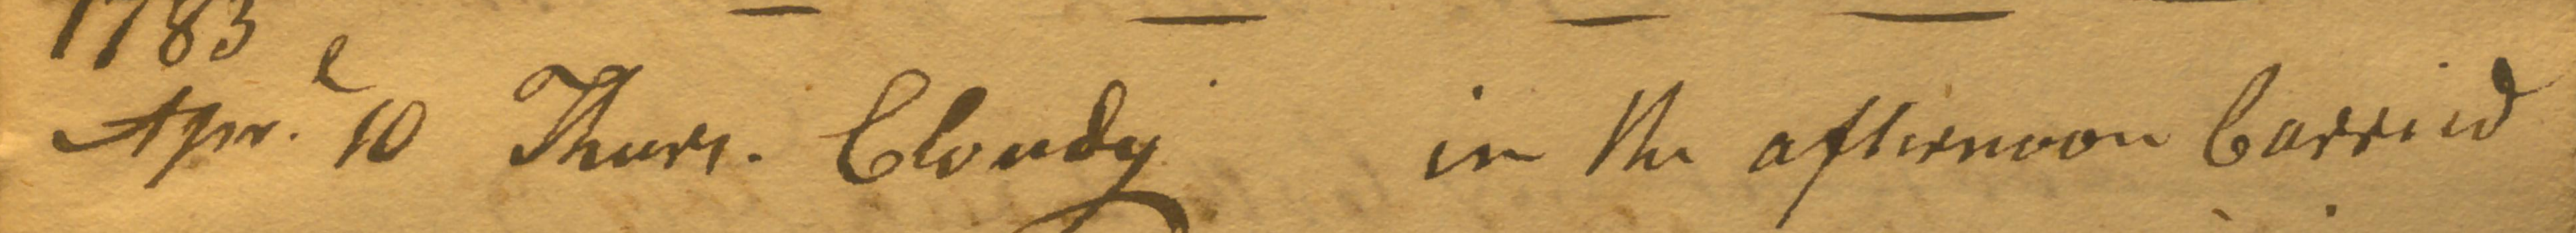Apr^l. 10 Thurs. Cloudy in the afternoon Carried
